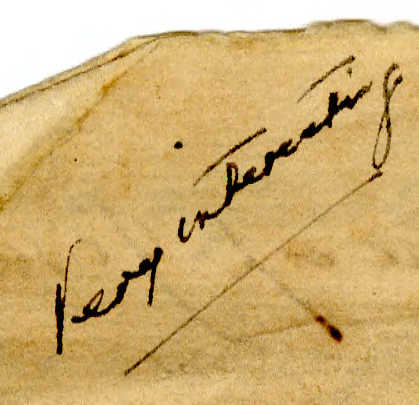Very interesting
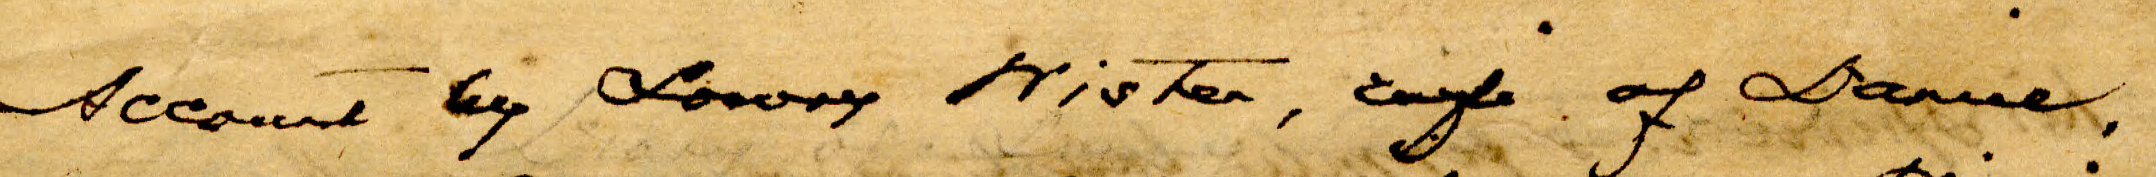Account by Lowry Wister, wife of Daniel,
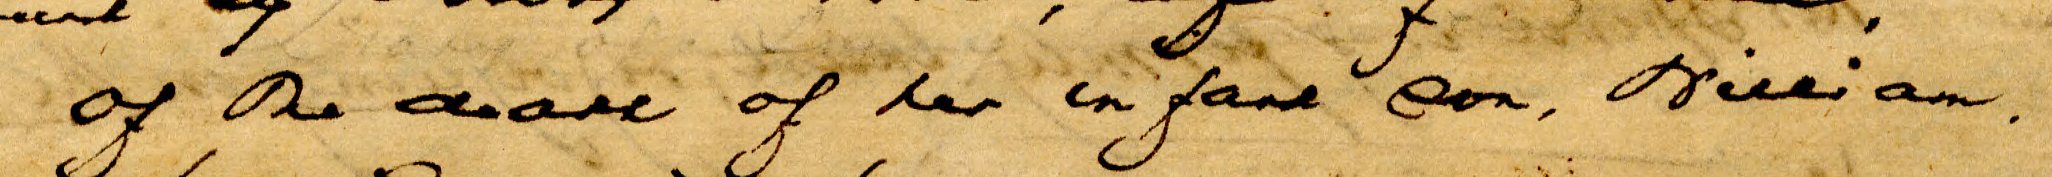of the death of her infant son, William.
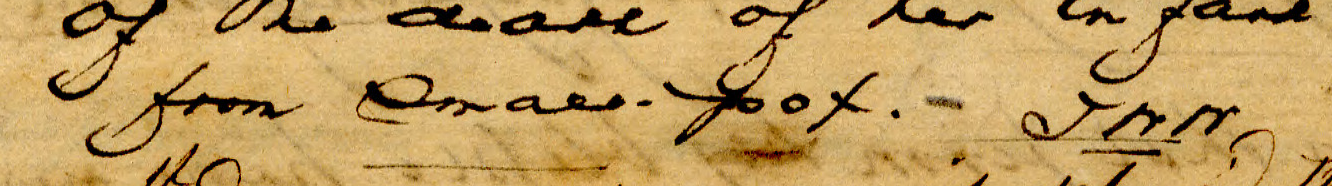from small-pox. JWW
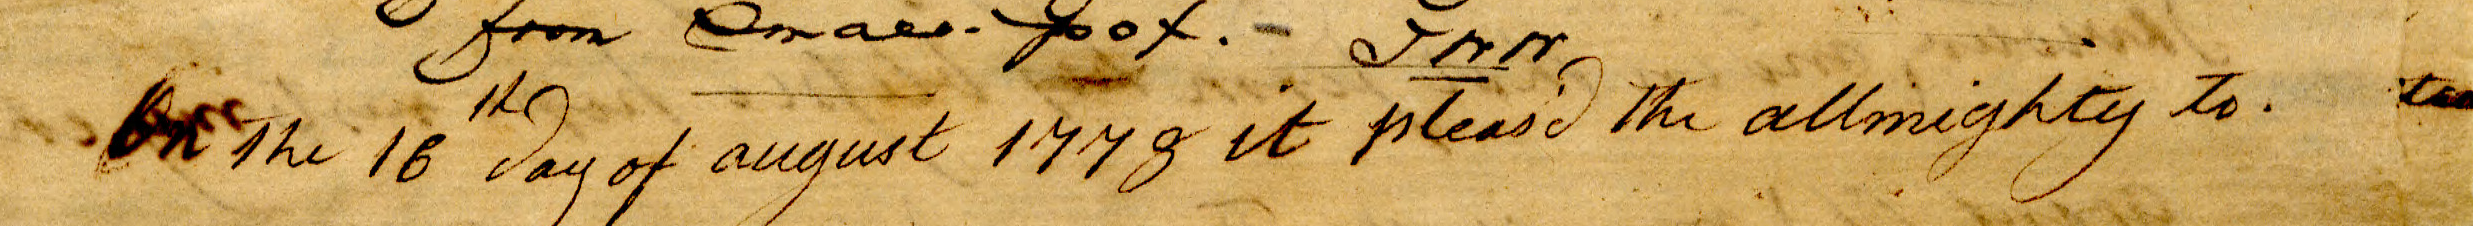On the 16^th day of august it pleas'd the allmighty to
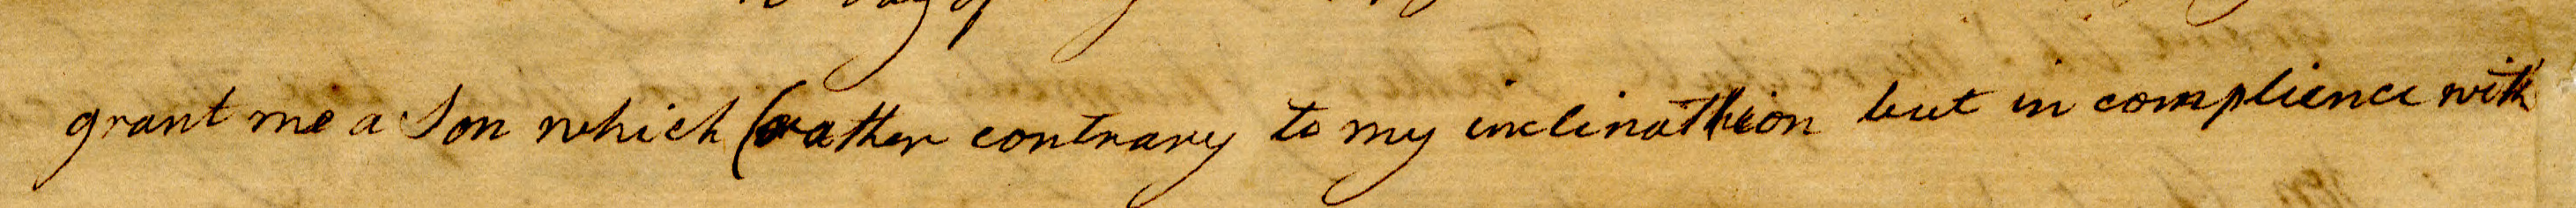grant me a son which (rather contrary to my inclination but in compliance with
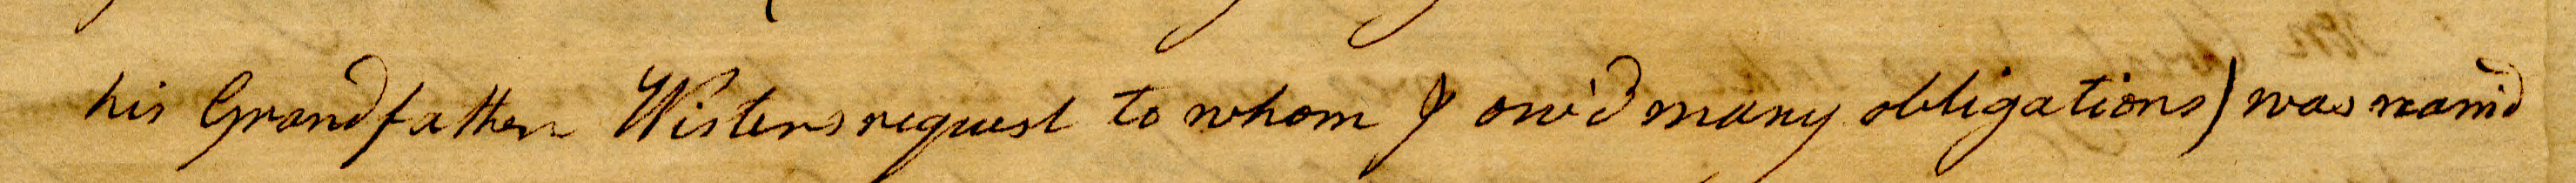his Grandfather Wisters request to whom I ow'd many obligations) was nam'd
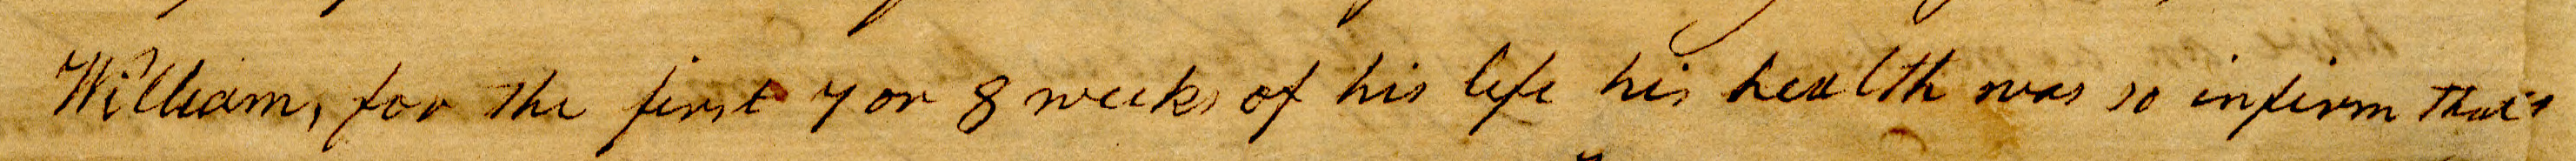William, for the first 7 or 8 weeks of his life his health was so infirm that
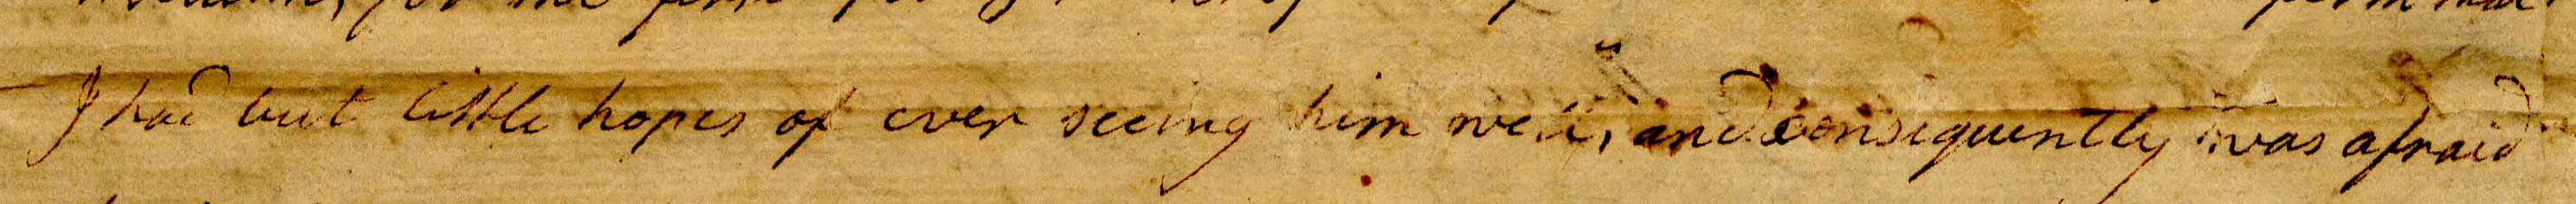I had but little hopes of ever seeing him well, and consequently was afraid
